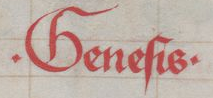.Geneſis.
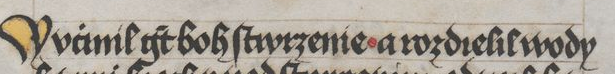Yvċiníl ḡt boh ſtwrzenie.a rozdielil wody
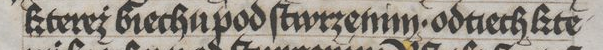ktereż biechu podſtwrzenim. odtiech kte¬
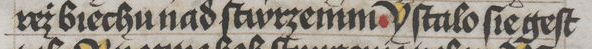reż biechu nad ſtwrzením.Yſtalo ſie geſt
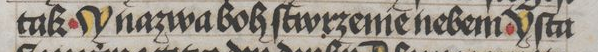tak.Y nazwa boh ſtwrzeníe nebem. Yſta
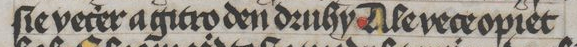ſíe veċer a gitro den druhy.Ale vece opiet
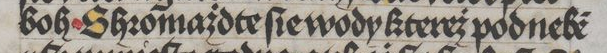boh.Shromaždte ſie wody ktereż pod nebē
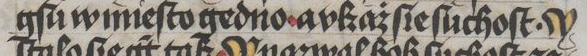gſu w mieſto gedno.a vkaż ſie ſuchoſt.Y
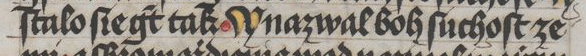ſtalo ſie ḡt tak.Ynazwal boh ſuchoſt ze¬
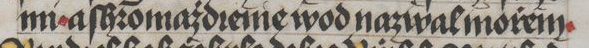mi.aſhromażdienie wod nazwal moṙem.
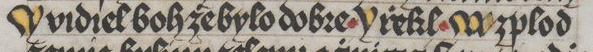Y vidiel boh żebylo dobre.Y ṙekl.Wzplod
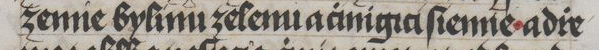zemie bylinu zelenu a ċínígicí ſíemie.a dṙe¬
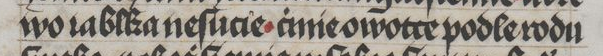wo iablka neſucie.ċiníe owotce podle rodu
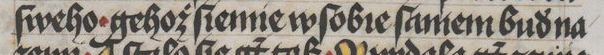ſweho.gehoż ſíemíe wſobie ſamen buḋ na¬
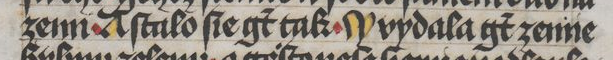zemi.Aſtalo ſie ḡt tak.Y vydala ḡt zemie
